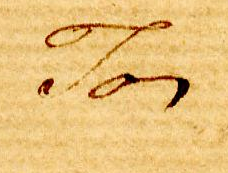For
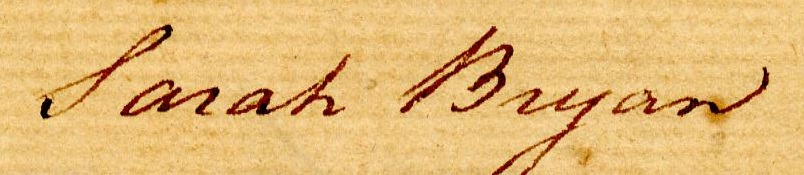Sarah Bryan
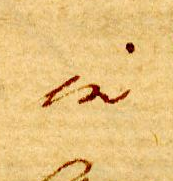in
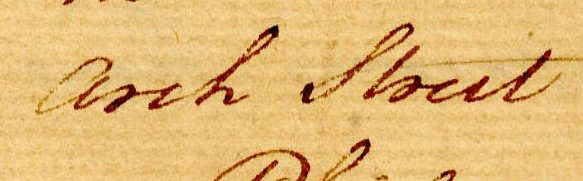Arch Street
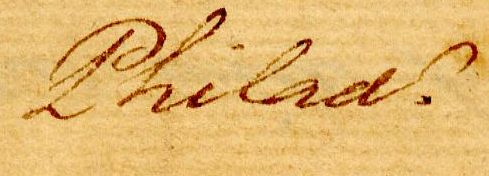Philad^a.
